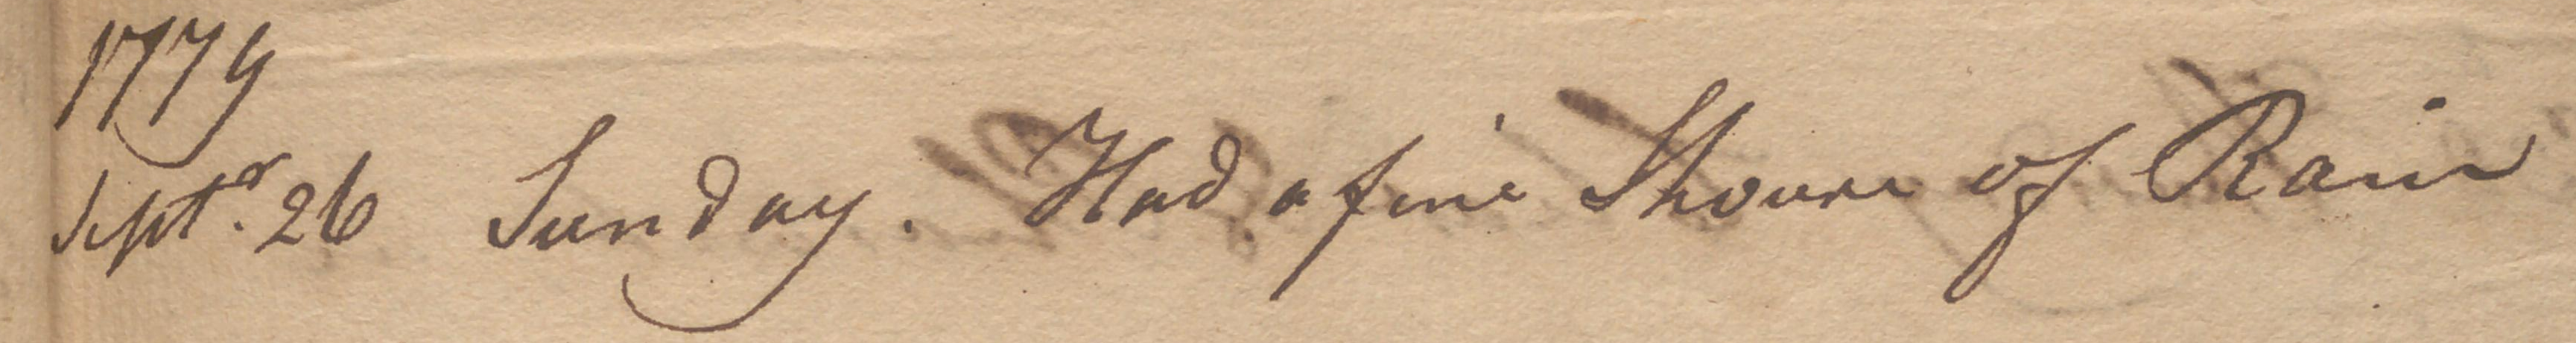Sept^r. 26 Sunday. Had a fine Shoure of Rain
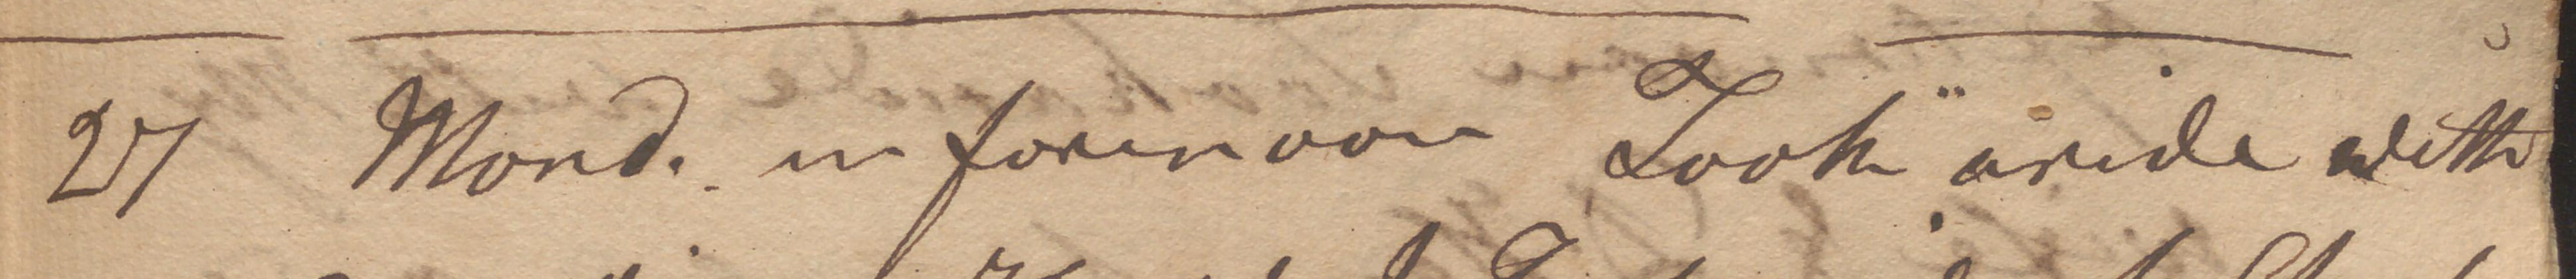27 Mond. in forenoon Took a ride with
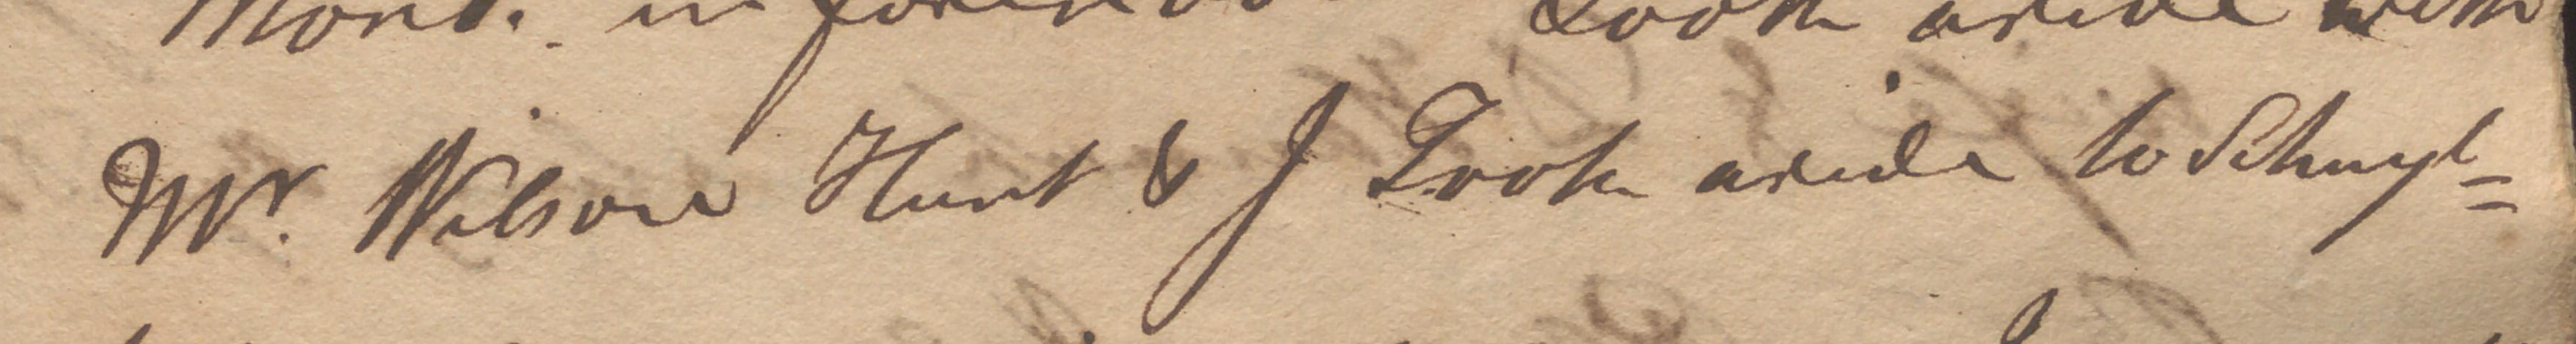M^r. Wilson Hunt & I Took a ride to Schuyl-
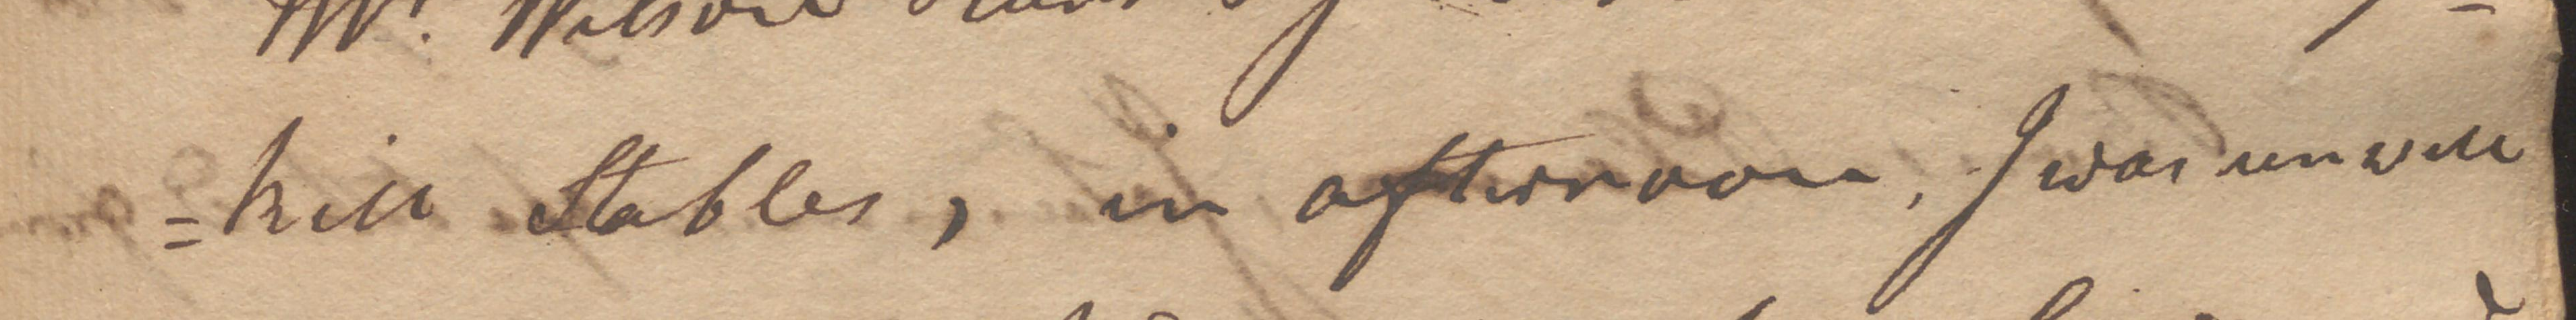-kill Stables, in afternoon, I was unwell
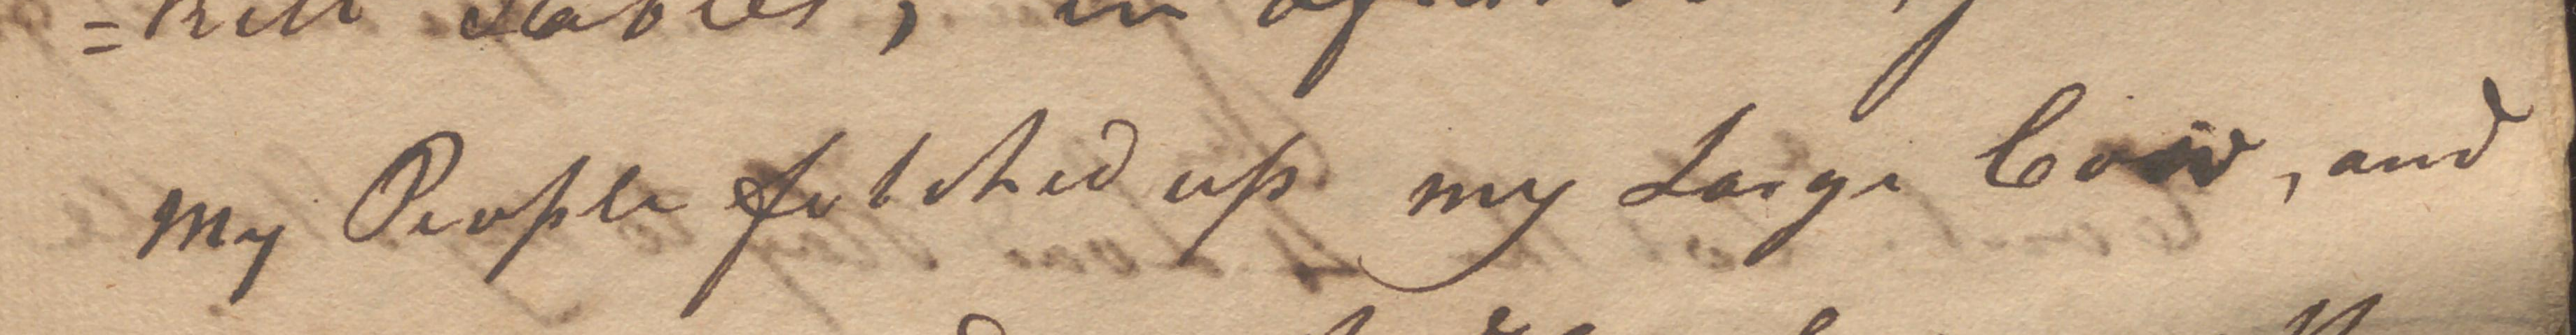my People fetched up my Large Cow, and
